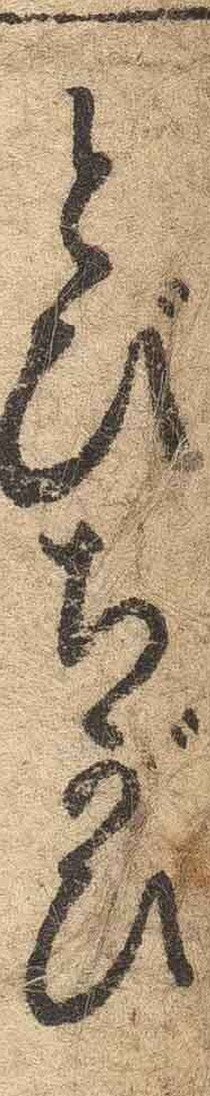とびちがひ
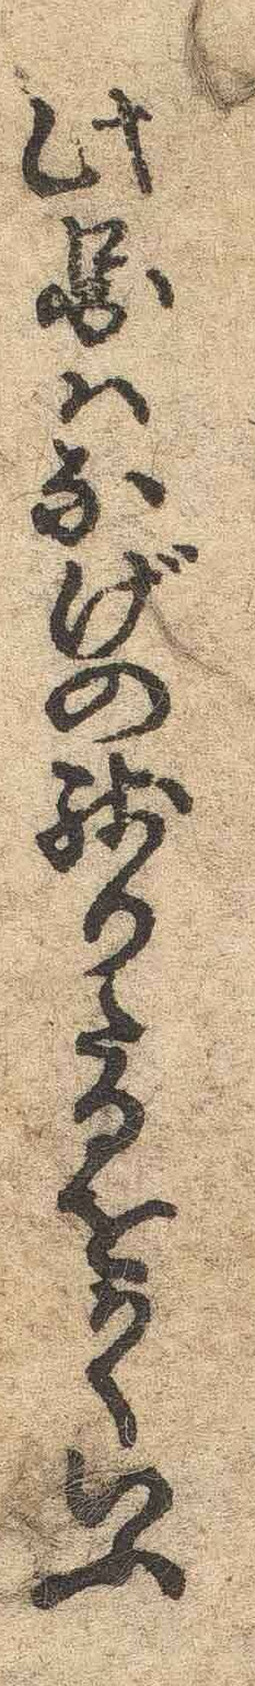此圖はなげの残り方をかくいふ
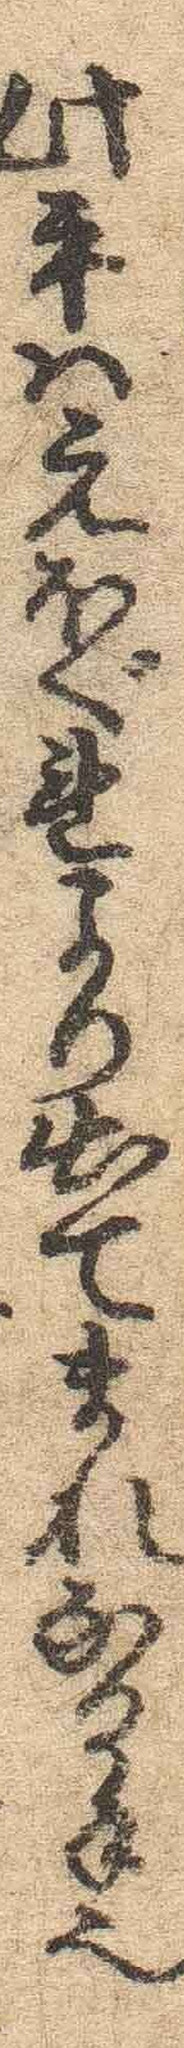此手は元ほぐれより出てまれなる手也

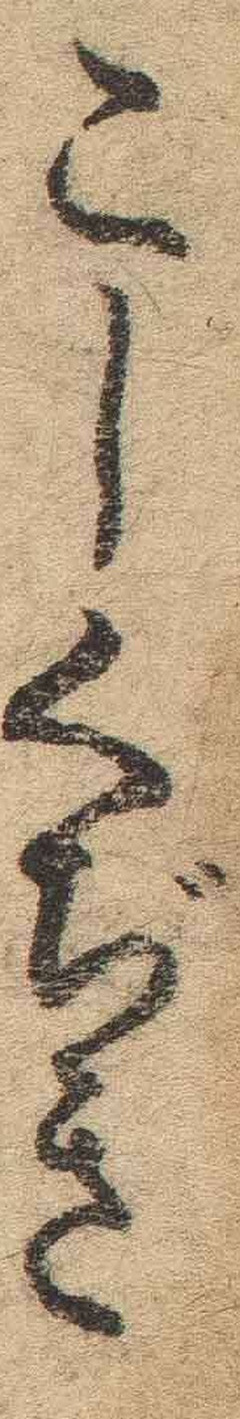こしくぢき
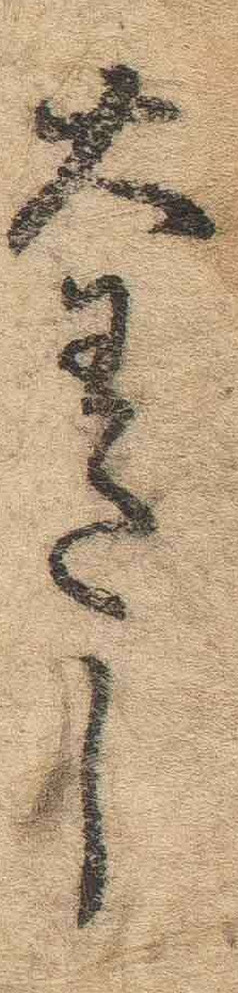大わたし
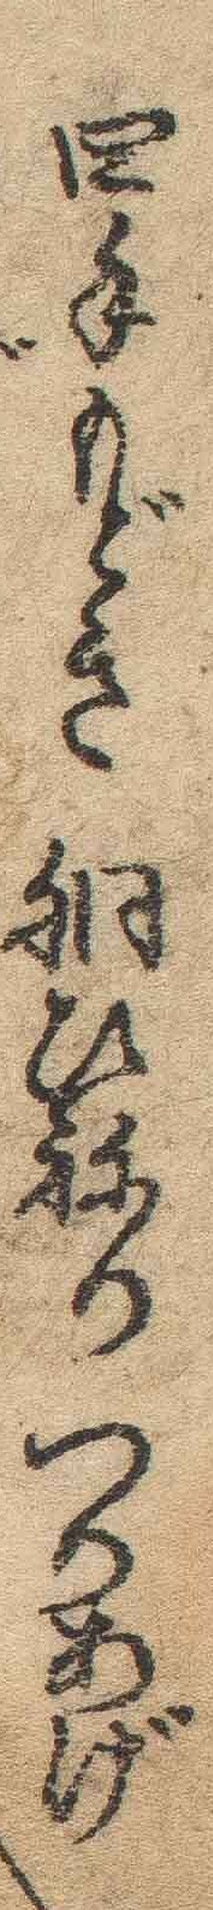四手もどき胴ひねりつりあげ
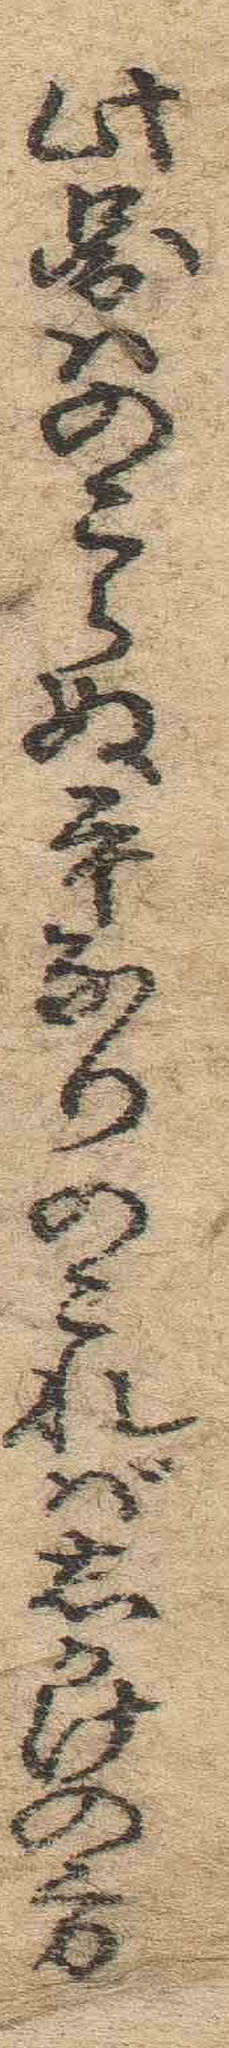此圖はのこらぬ手なりのこればしかけの方
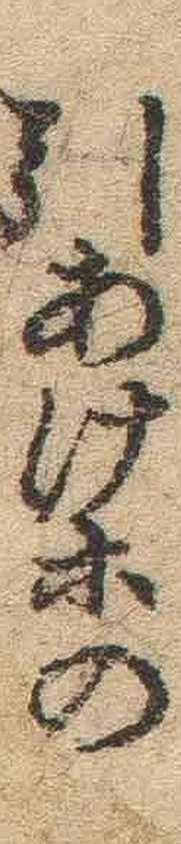引あげ等の
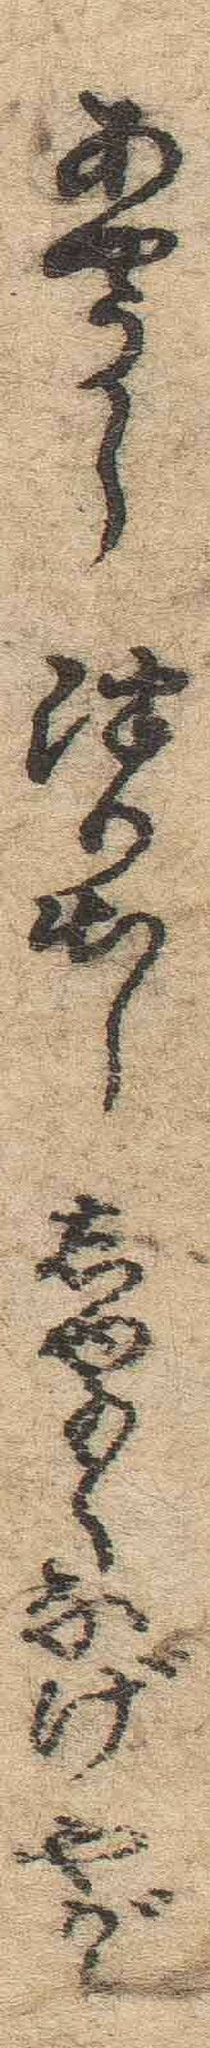あやうしつり出ししやもくなげやがら
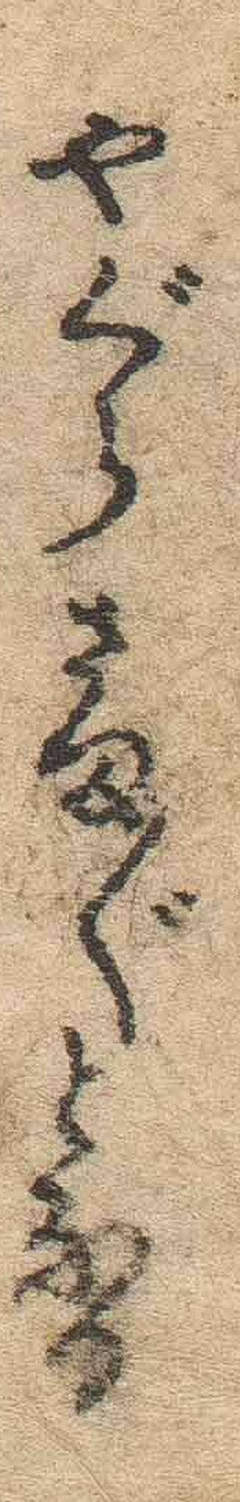やぐらさま〴〵となる
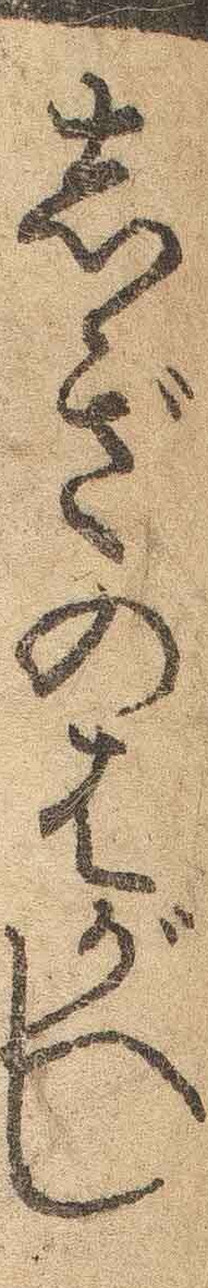しぎのはがへし
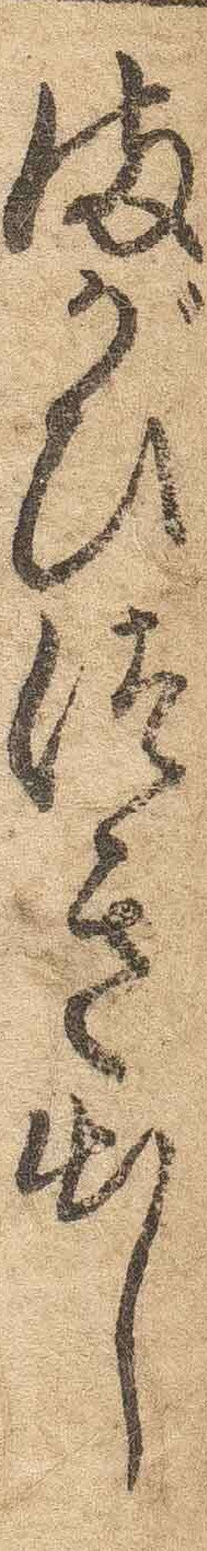まがひつき出し
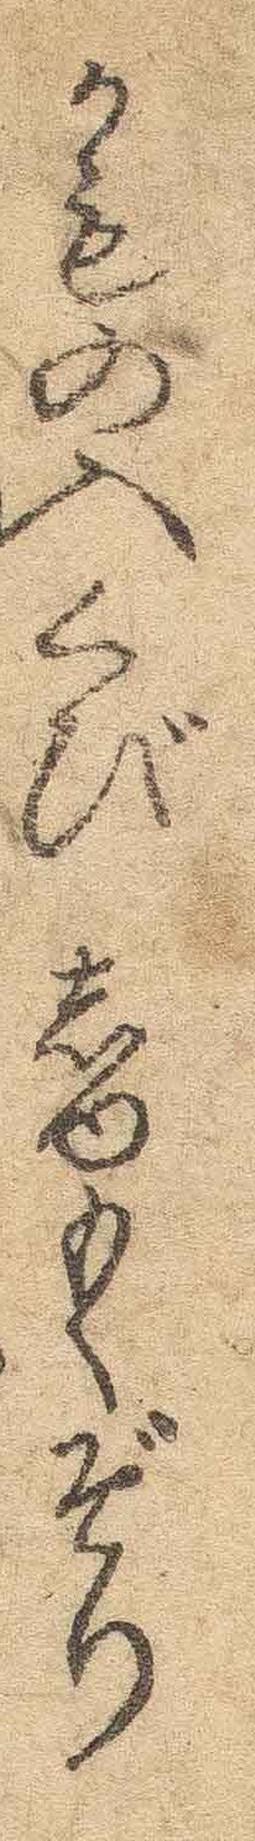鴨の入くびしやもくぞり
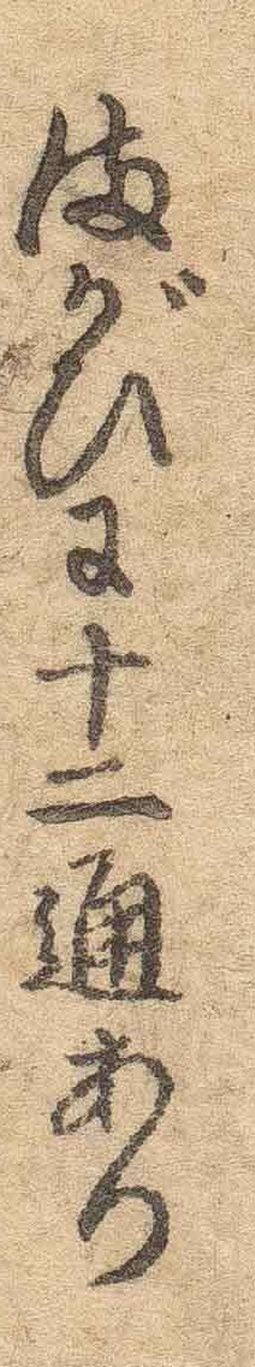まがひに十二通あり
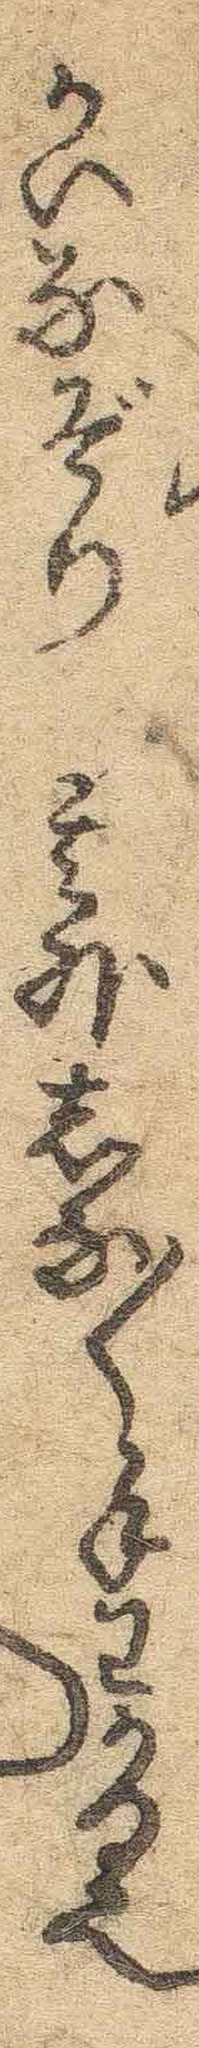かいなぞり其外しな〳〵手わかる也

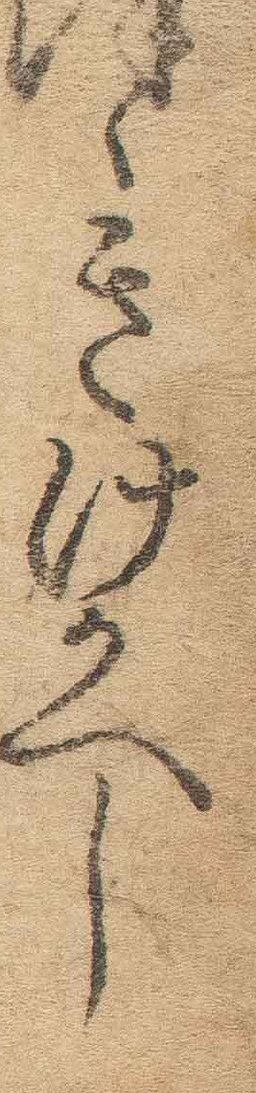つきけかへし
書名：古今相撲大全
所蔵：東京学芸大学附属図書館 国文学研究資料館
